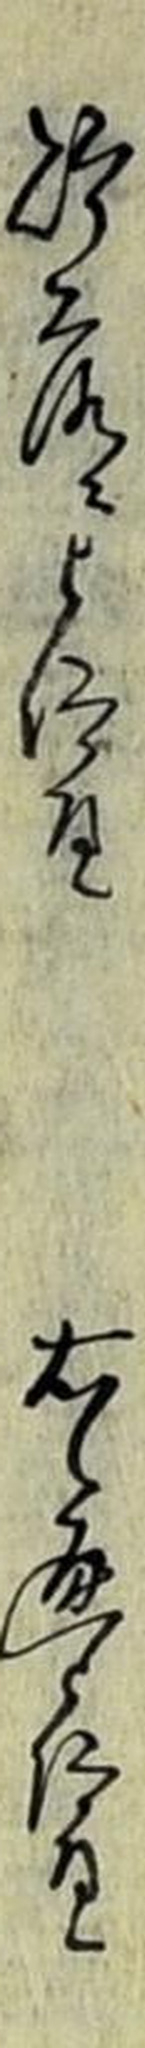貯落ニ被仰付候右之通被仰付候
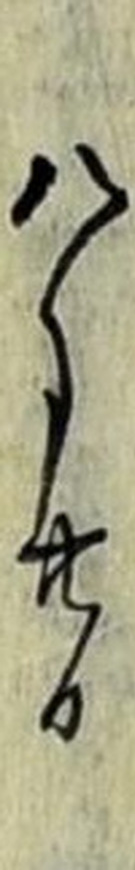八月廿日
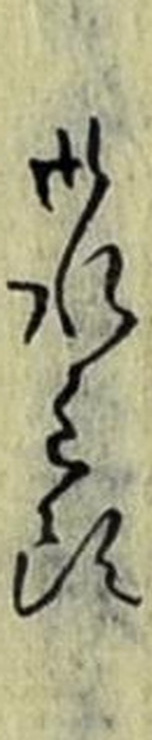御水主頭
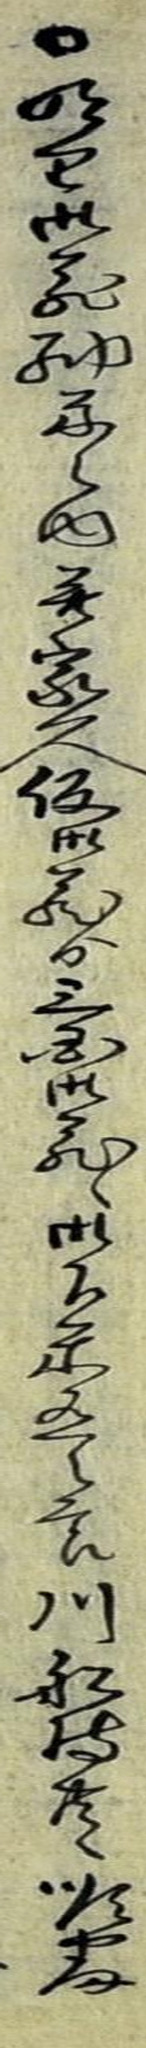〇明里御蔵納米之内并家久仮御蔵ゟ三国御蔵へ御下米有之節川船持共へ順番
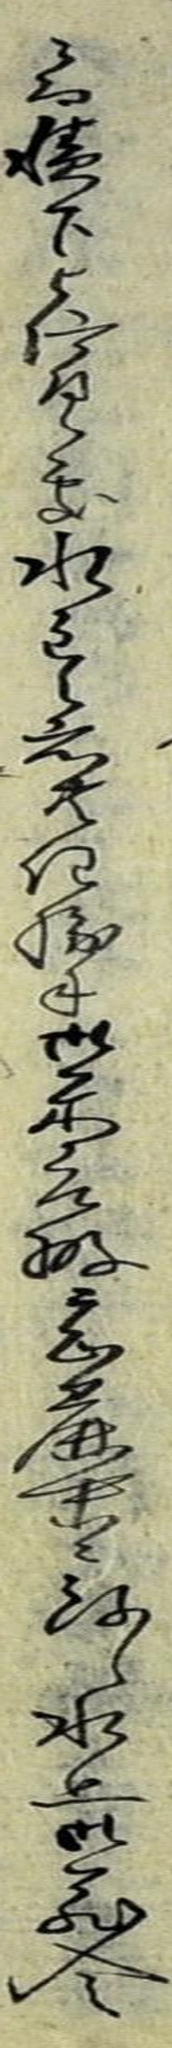ニ而積下被仰付候処水主之者共任勝手御米取扱甚麁末ニ致し水上御蔵入之
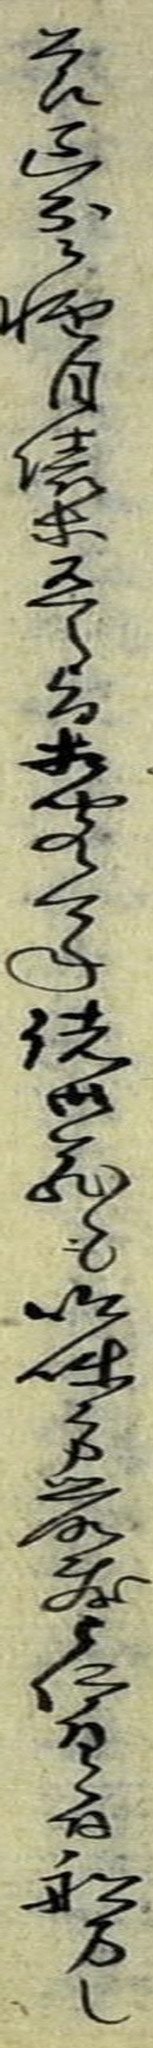節過分ニ軽目俵等有之旨相聞今年諸御蔵へも吟味方厳敷被仰付候ニ付船方之
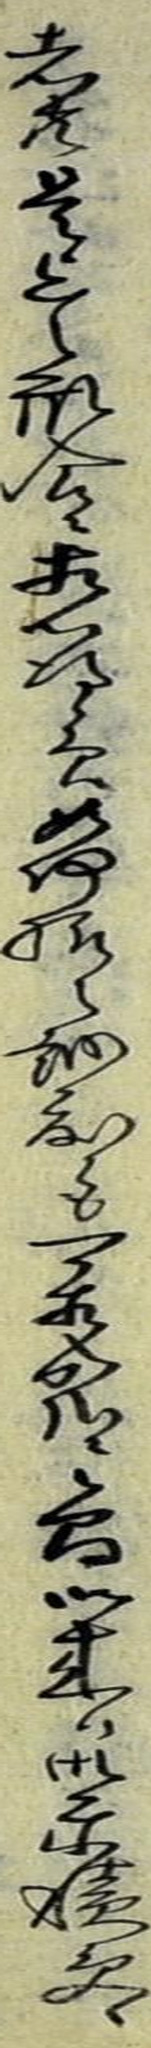者共是迄之形合ニ相心得候而ハ如何様之越度とも可相成哉ニ候間以来ハ御米積受候
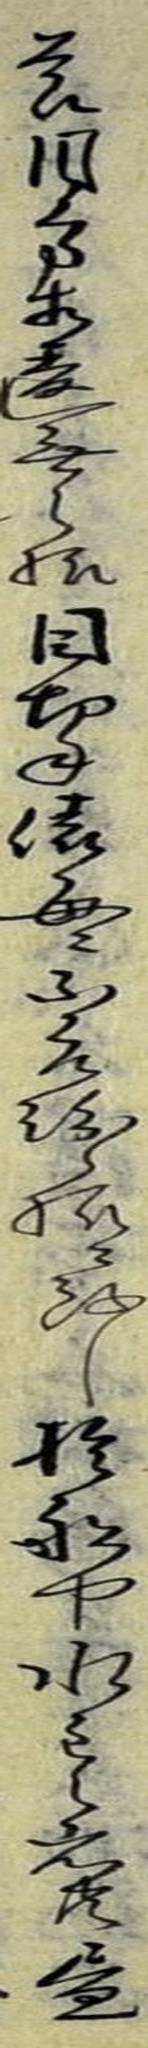節目方相違無之様目切手俵毎ニ不取紛様ニ致し於船中水主之者共昼
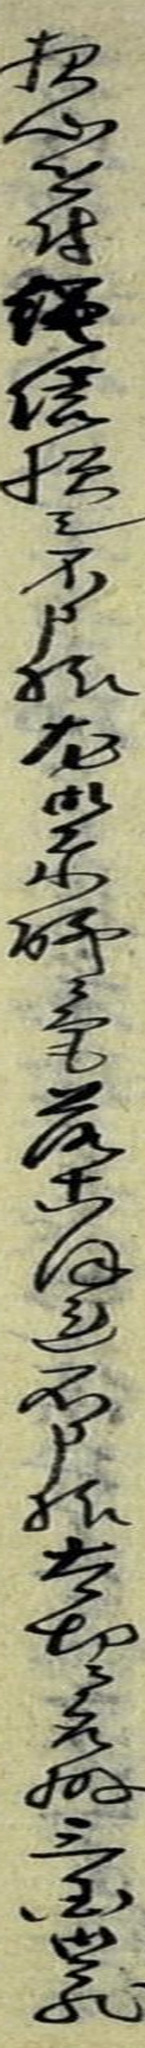夜心を付縄俵損シ不申様尤御米聊ニ而も落こほれ不申様太切ニ取扱三国御蔵
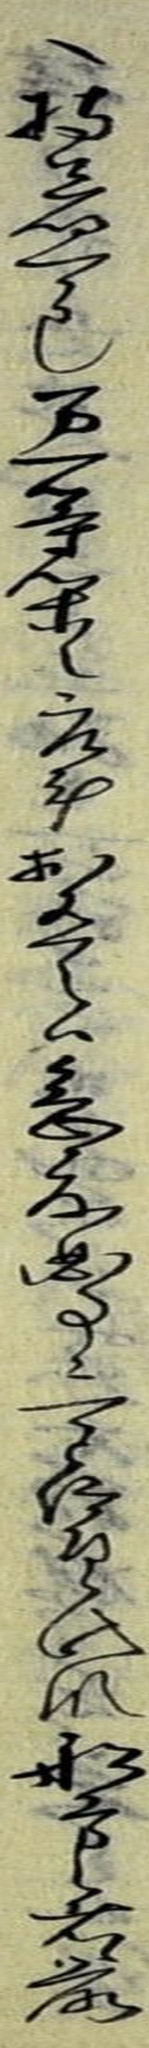へ持着可申候万一等閑之取計於有之ハ急度曲事ニ可被仰付候此段船方之者へ厳
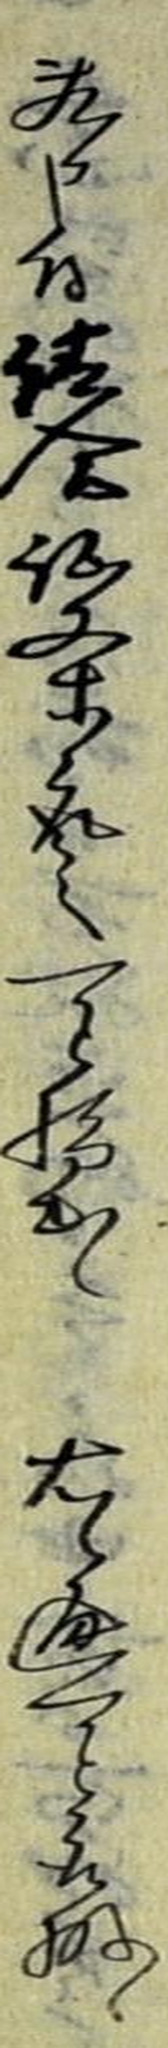敷申付請合証文等取之可被指出候右之通可被取扱候
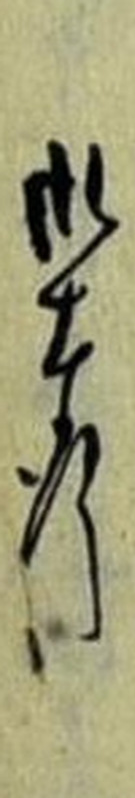御奉行
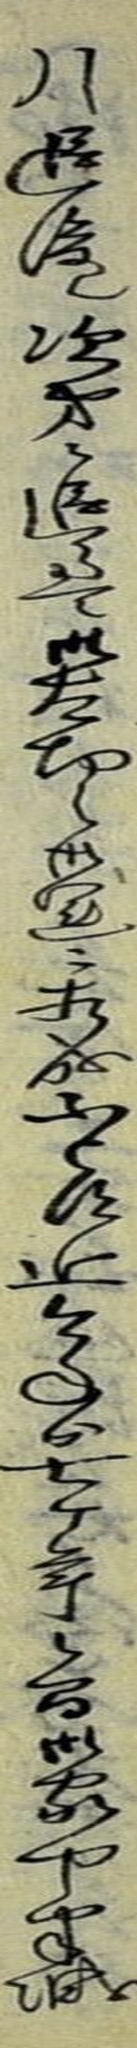引追後レ次第ニ追畳御太切之御運ニ相成不被得止今年ゟ七ケ年之間御家中半減
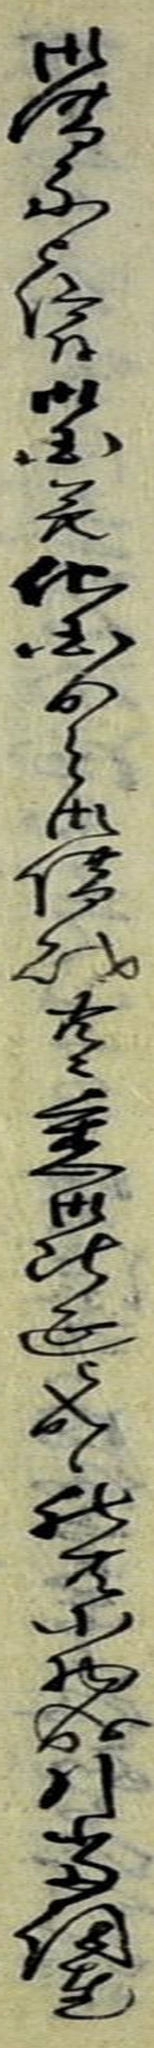御借米被仰付御国并他国ゟ之御借財共ニ悉御断延被成候然共小物成引当調達
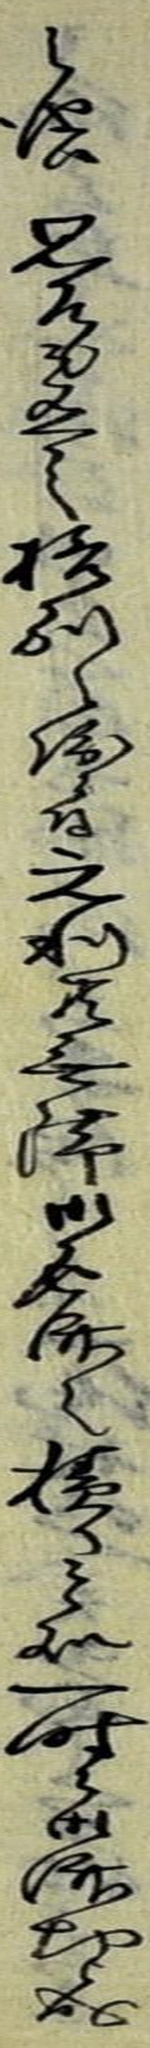之儀ハ思召も有之格別之儀ニ付元利共無滞御返済之積りニ候処一時ニ御済切被成
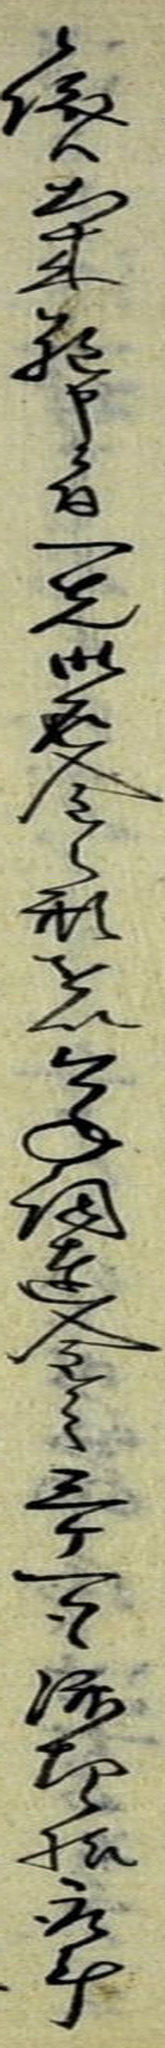候儀ハ出来難申ニ付一先御返金之形を以今年調達金之三ケ一ツヽ済切候様取計
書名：命令之部 三
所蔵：福井県文書館 Fukui Prefectural Archives
